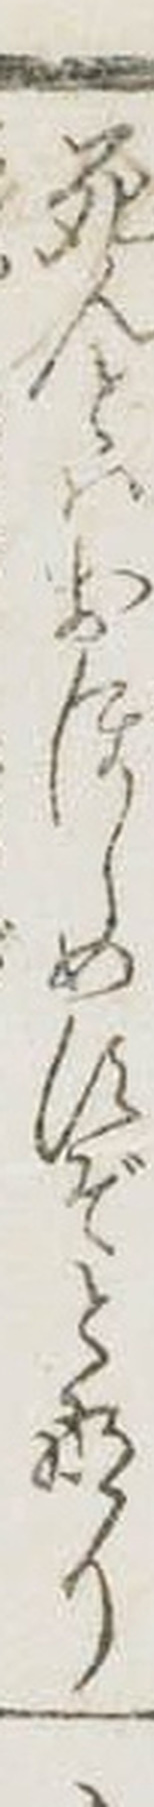死んとはおぼしめすぞとなり
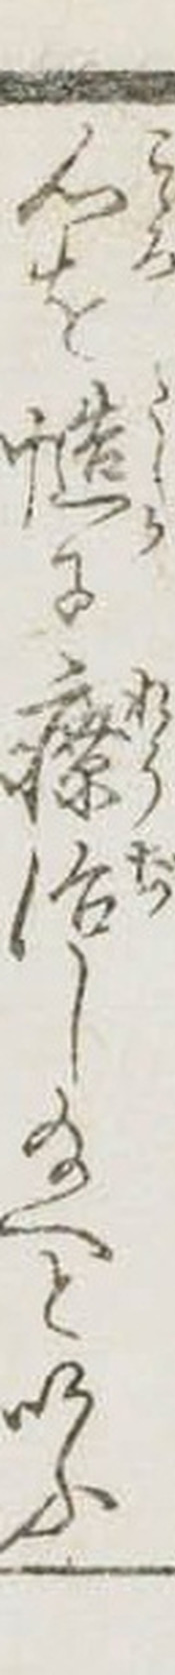心を慥に療治し給へといふ
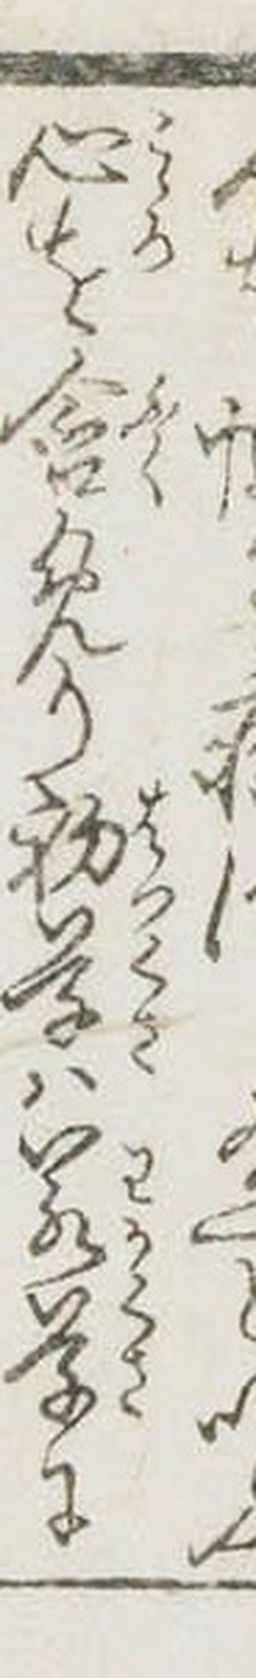心を含めり初草は若草に
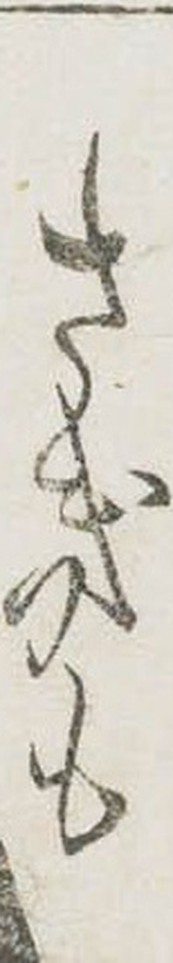さきも
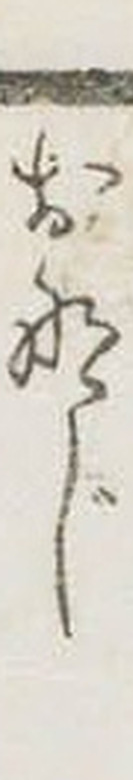おなじ
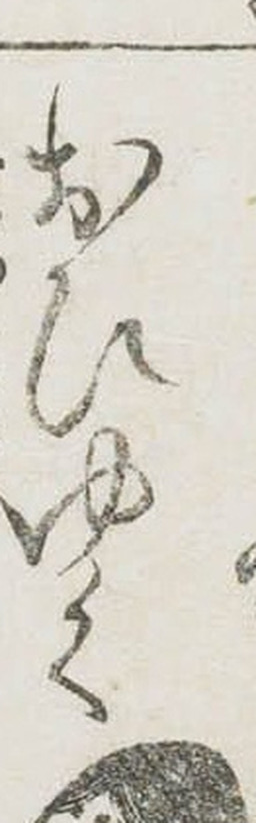おひゆく
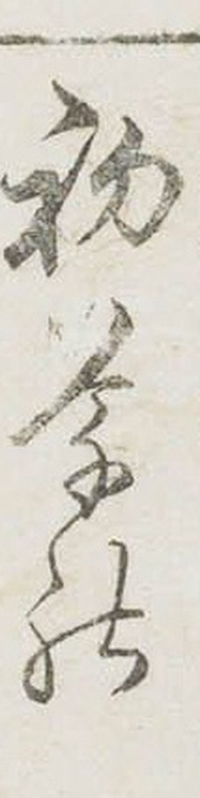初草の
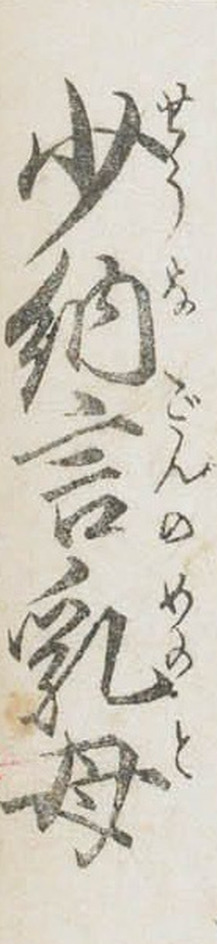少納言乳母
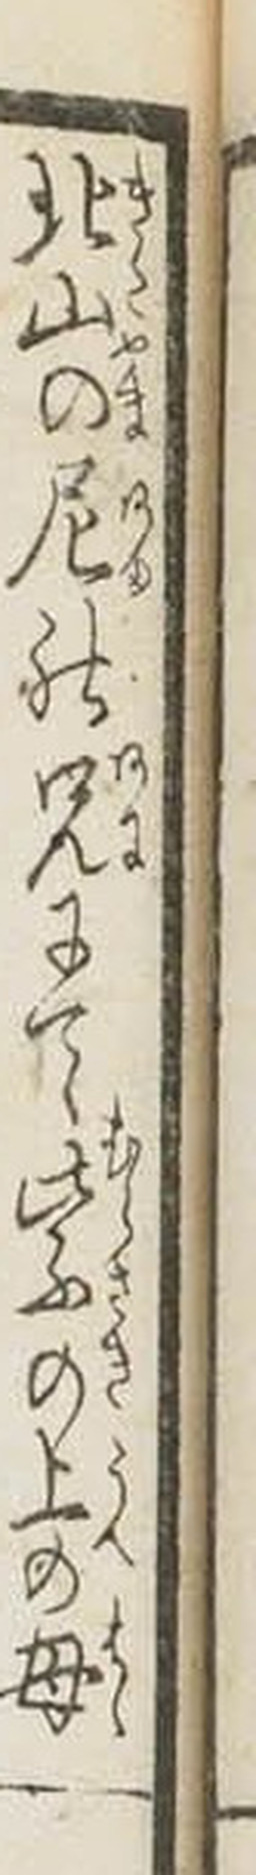北山の尼の兄にて紫の上の母
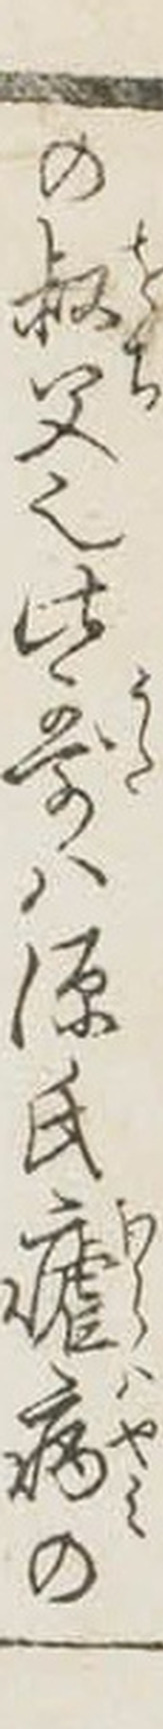の叔父也此哥は源氏瘧病の
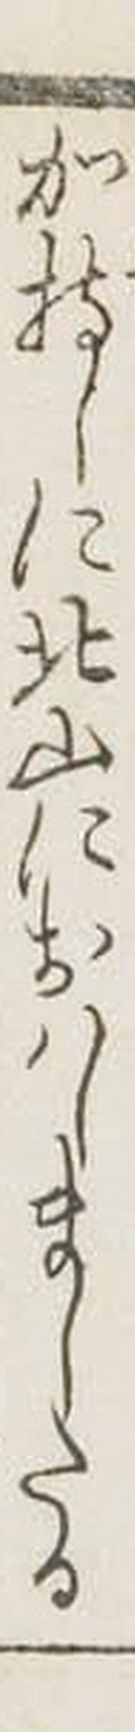加持しに北山におはしましたる
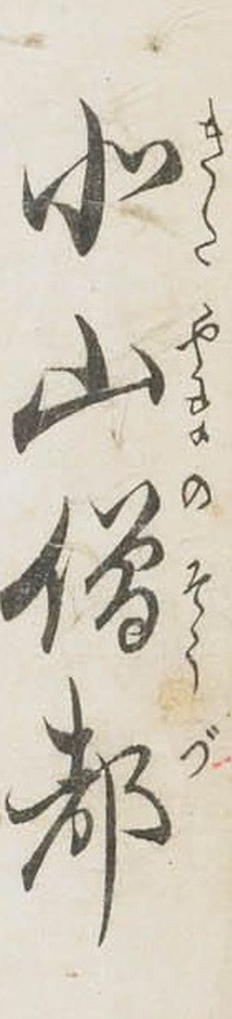北山僧都
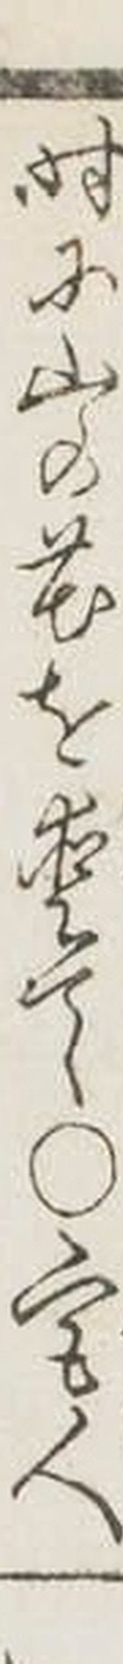時に山の花を愛て○宮人
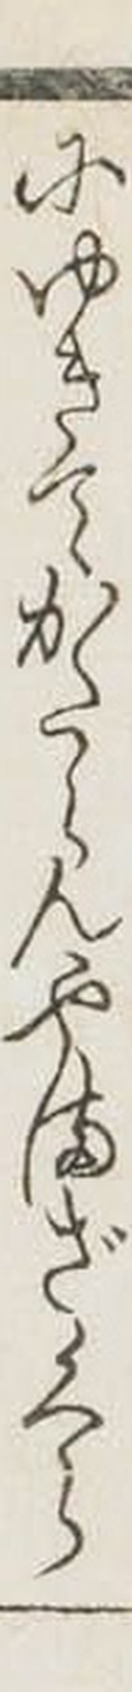にゆきてかたらんやまざくら
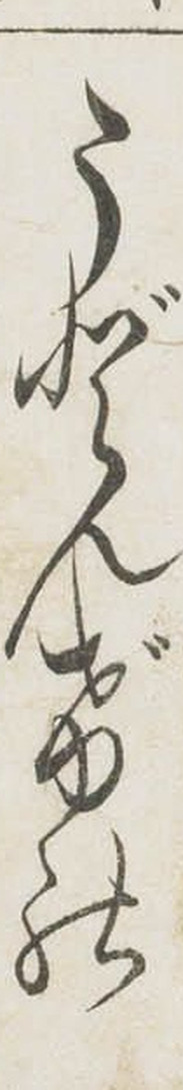うどんげの
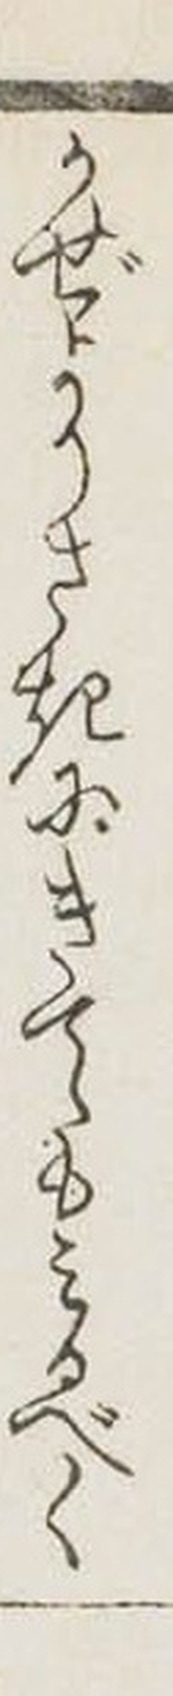かぜよりさきにきてもみるべく
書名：源氏百人一首
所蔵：東京学芸大学教育コンテンツアーカイブ
